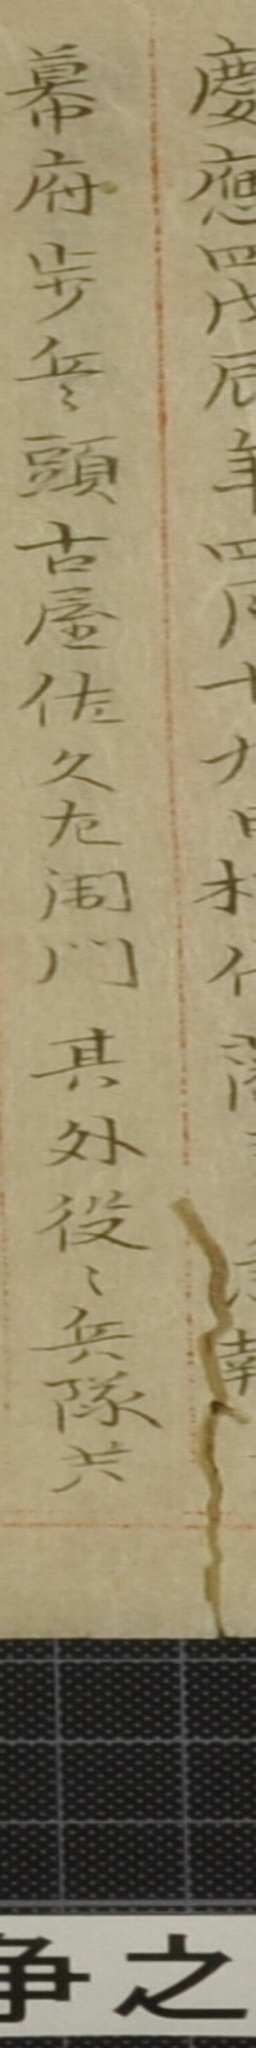幕府歩兵頭古屋佐久左衛門其外役々兵隊共
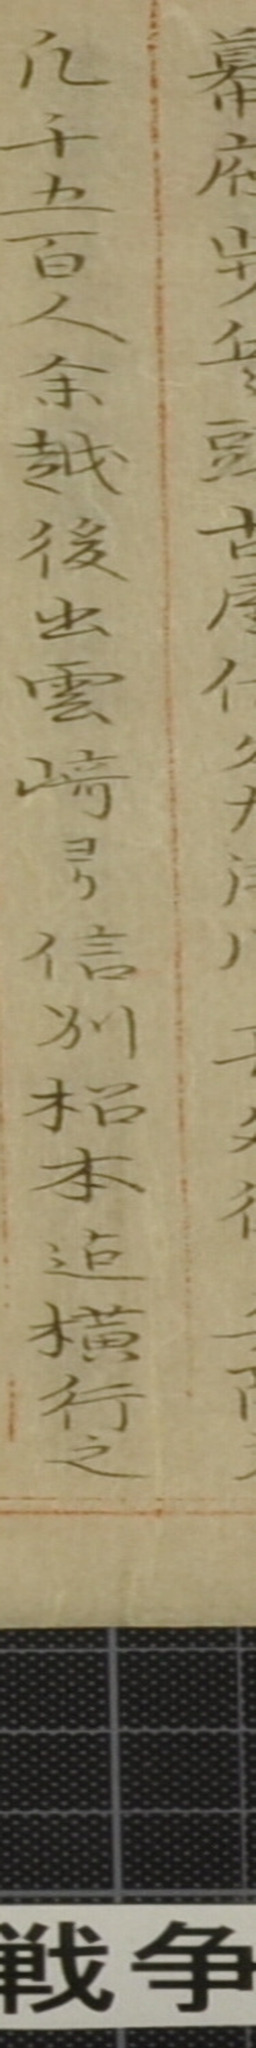凡千五百人余越後出雲崎ヨリ信州松本迄横行之
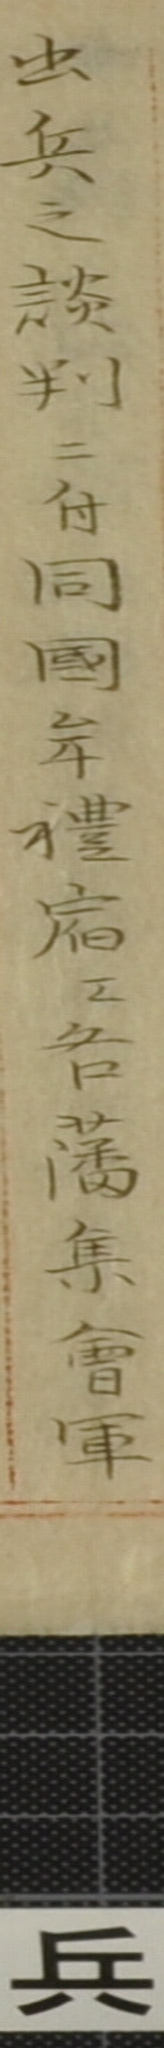出兵之談判ニ付同国牟禮宿エ各藩集會軍
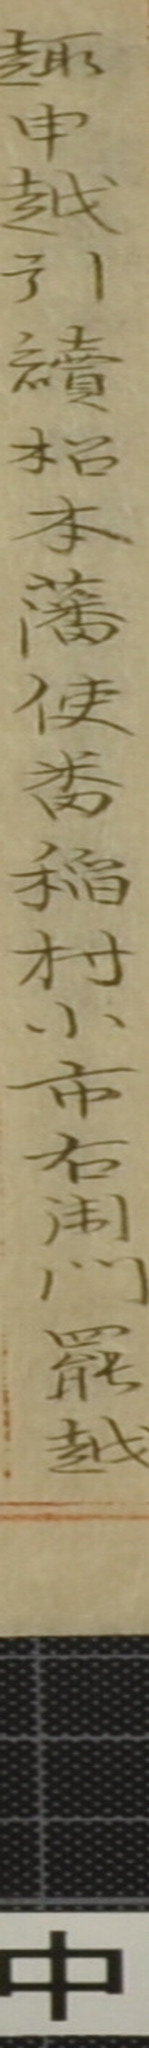趣申越引続松本藩使番稲村小市右衛門罷越
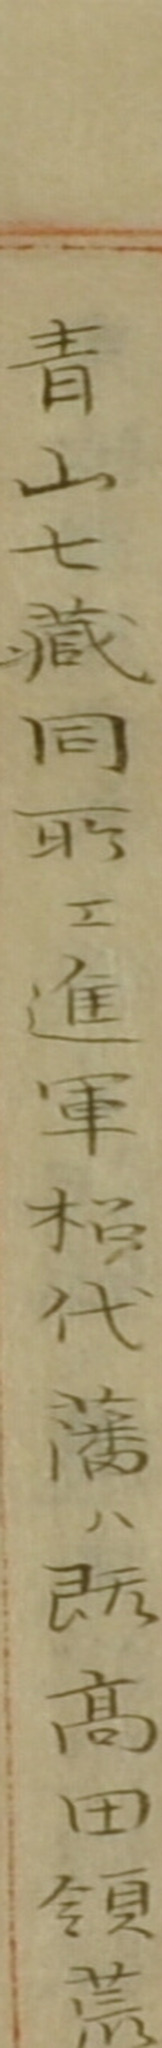青山七蔵同所エ進軍松代藩ハ既高田領荒
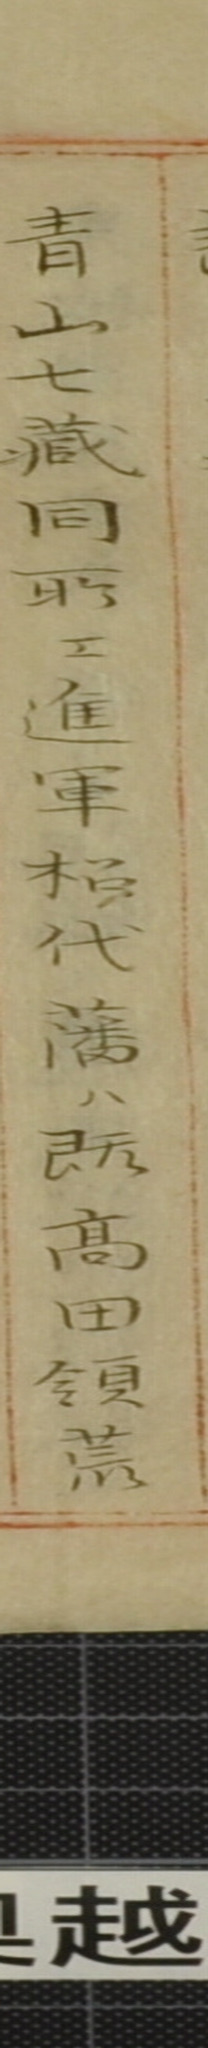青山七蔵同所エ進軍松代藩ハ既高田領荒
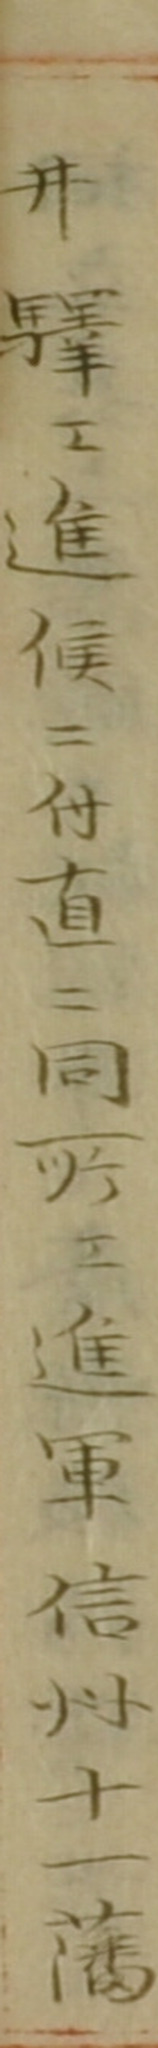井駅エ進侯ニ付直ニ同所エ進軍信州十一藩
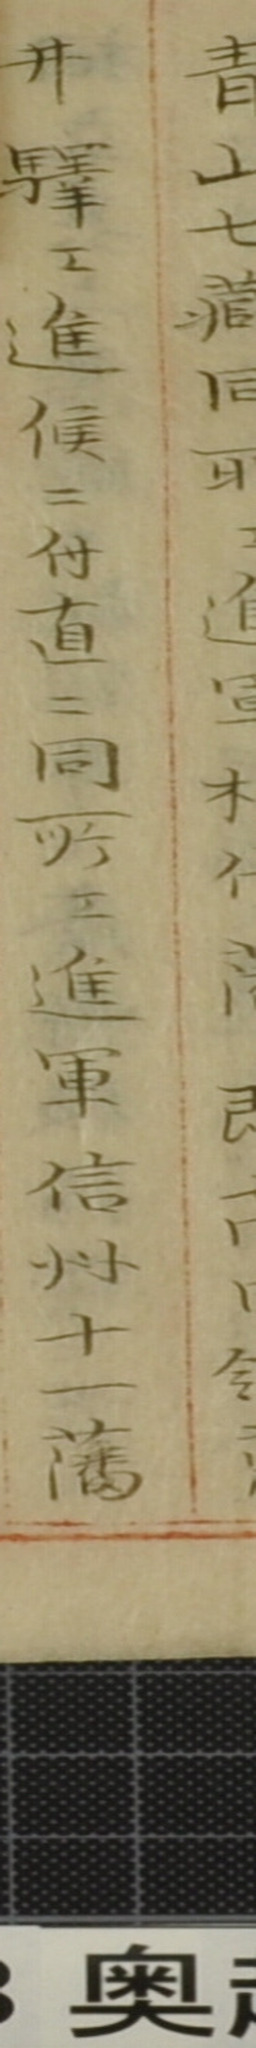井駅エ進侯ニ付直ニ同所エ進軍信州十一藩
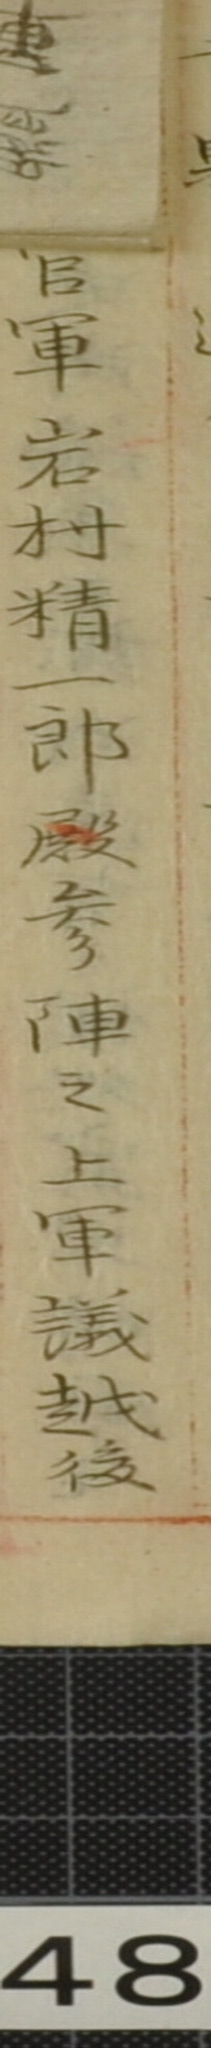官軍岩村精一郎殿参陣之上軍議越後
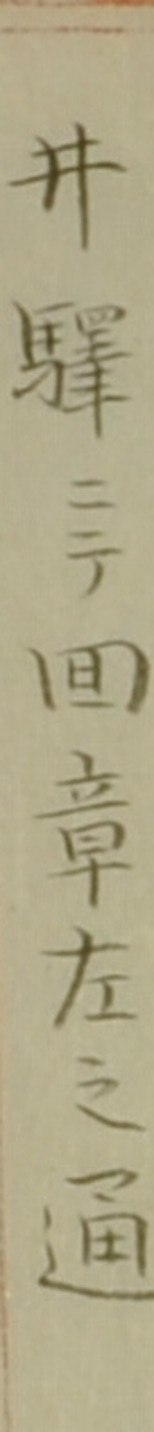井駅ニテ回章左之通
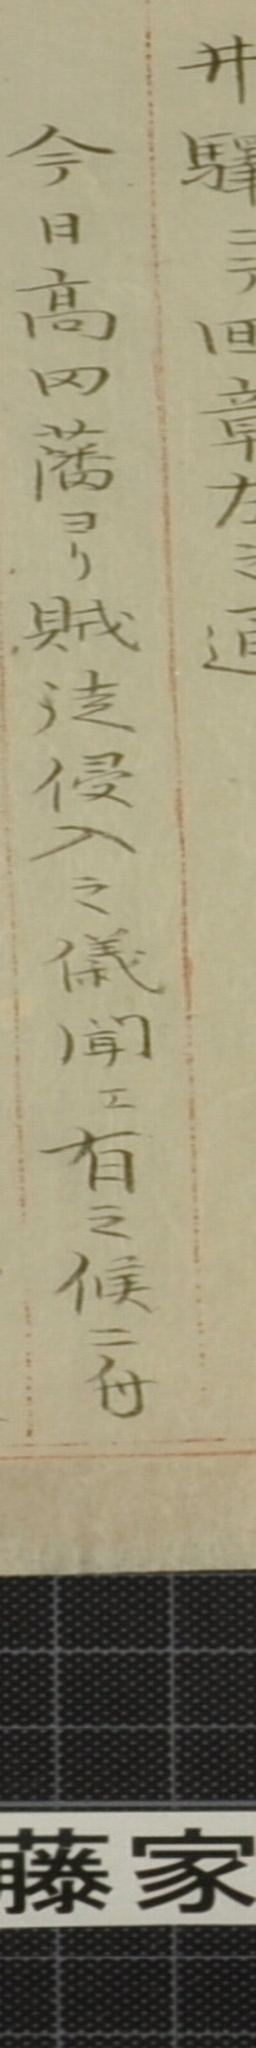今日高田藩ヨリ賊徒侵入之儀聞エ有之候ニ付
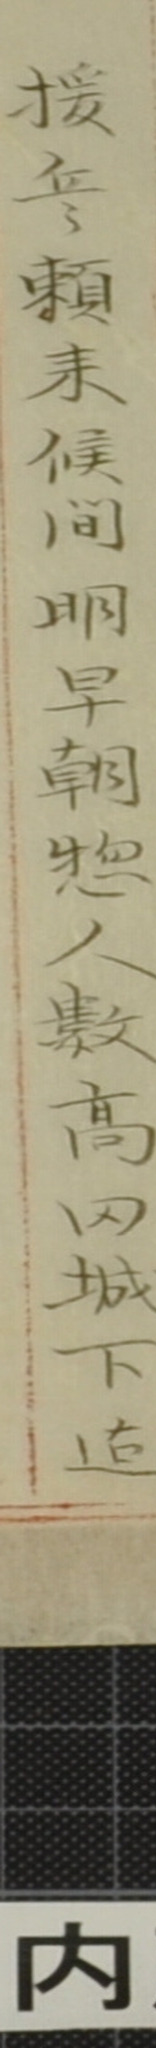援兵頼来候間明早朝惣人数高田城下迄

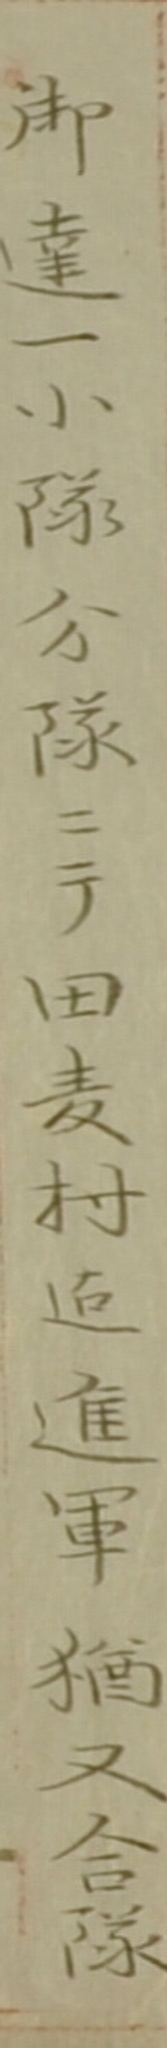御達一小隊分隊ニテ田麦村迄進軍猶又合隊
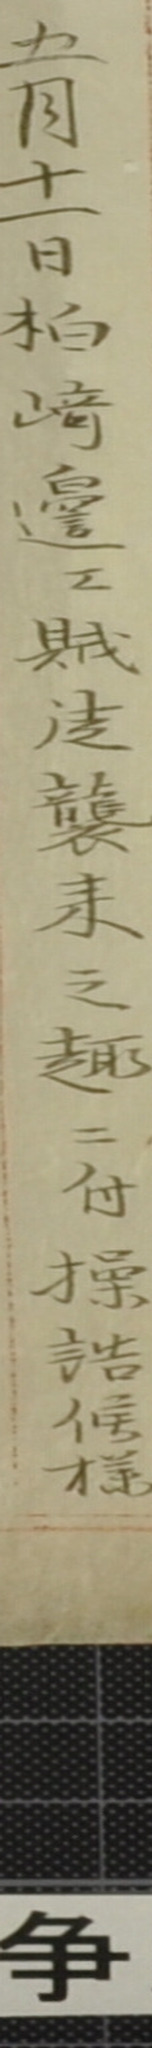五月十一日柏崎辺エ賊徒襲来之趣ニ付操詰候様
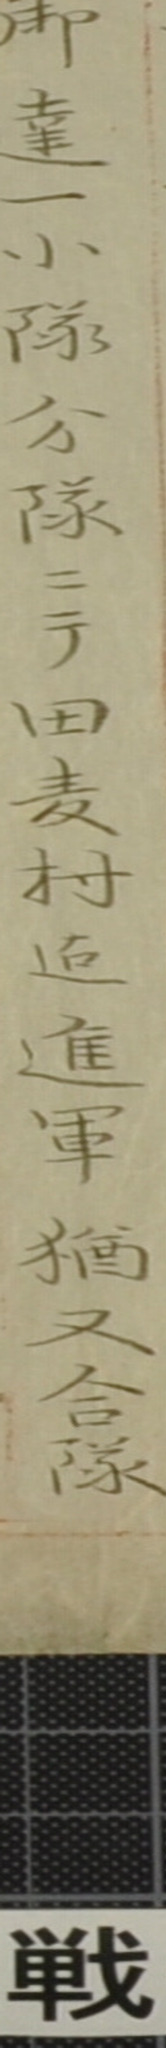御達一小隊分隊ニテ田麦村迄進軍猶又合隊
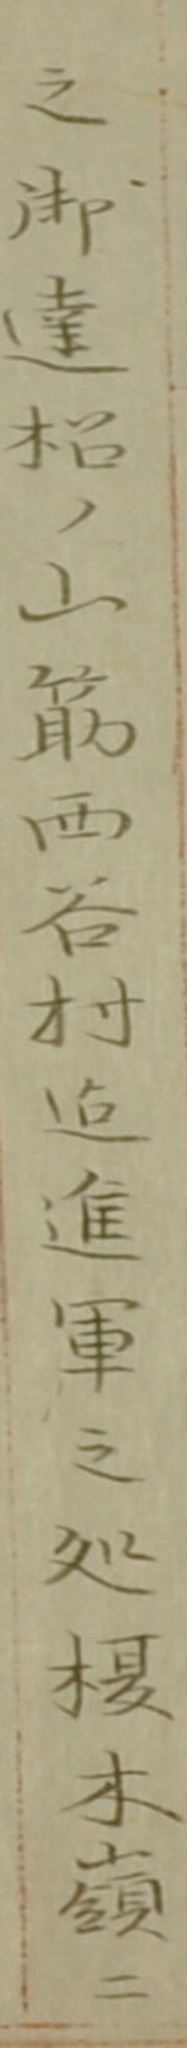之御達松ノ山筋西谷村迄進軍之処榎木嶺ニ
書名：奥越出兵中戦争之事件概略抄録（控）
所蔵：伊那市立高遠町図書館・合同会社AMANE
